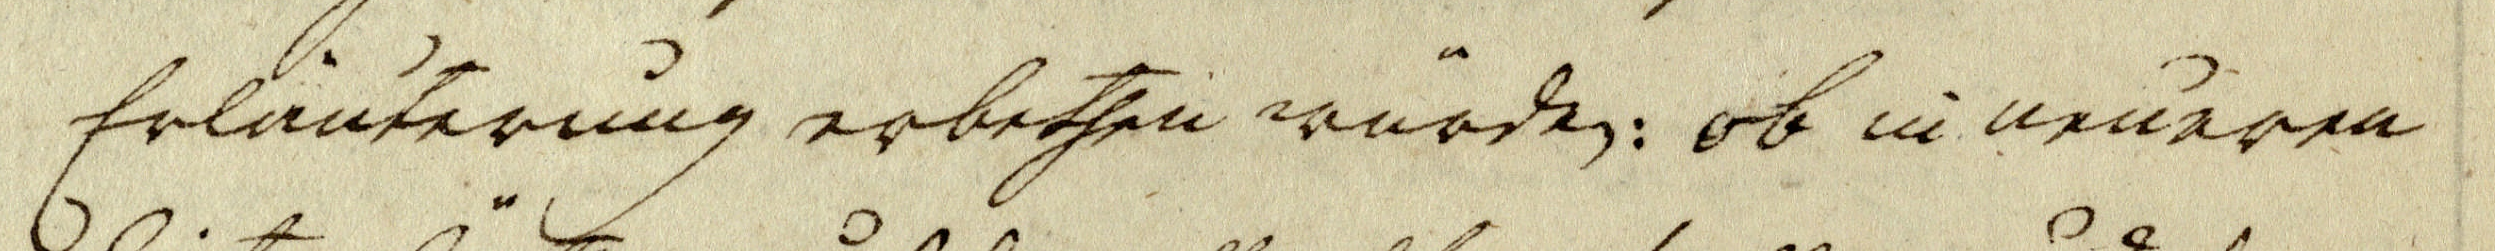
Erläuterung erbethen würde: ob in neueren
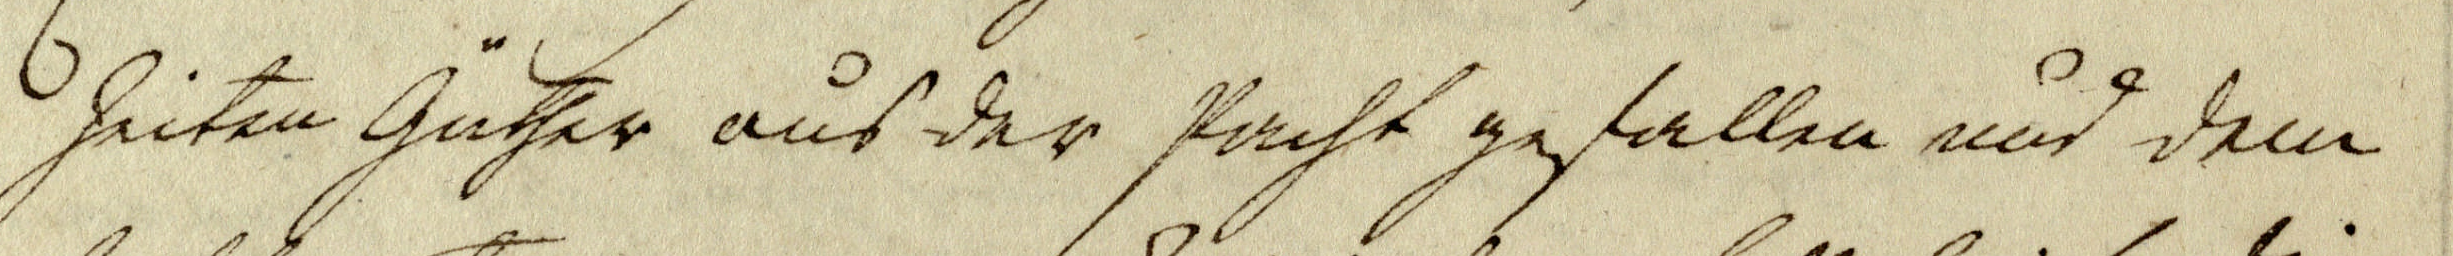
Zeiten Güther aus der Pacht gefallen und dem
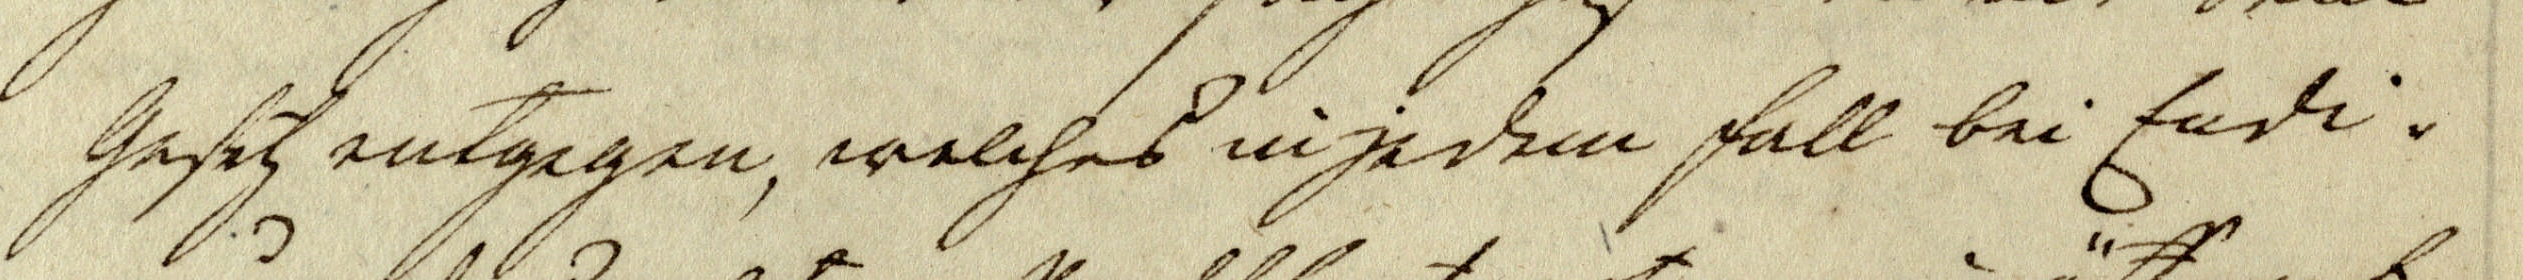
Gesetz entgegen, welches injedem Fall bei Endi¬
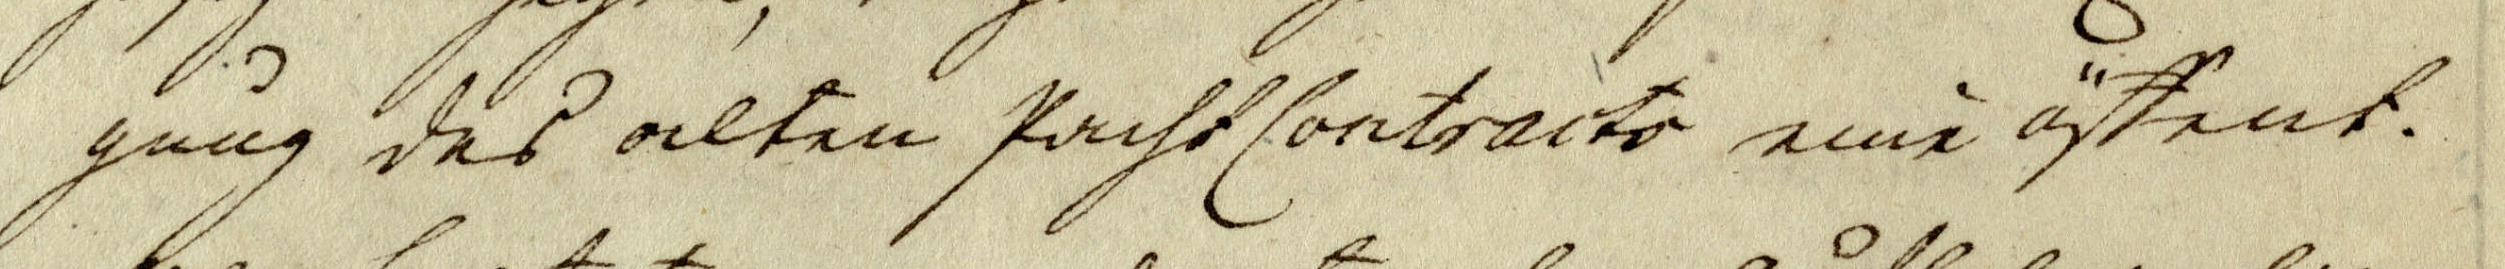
gung des alten Pacht Contracts eine öffent¬
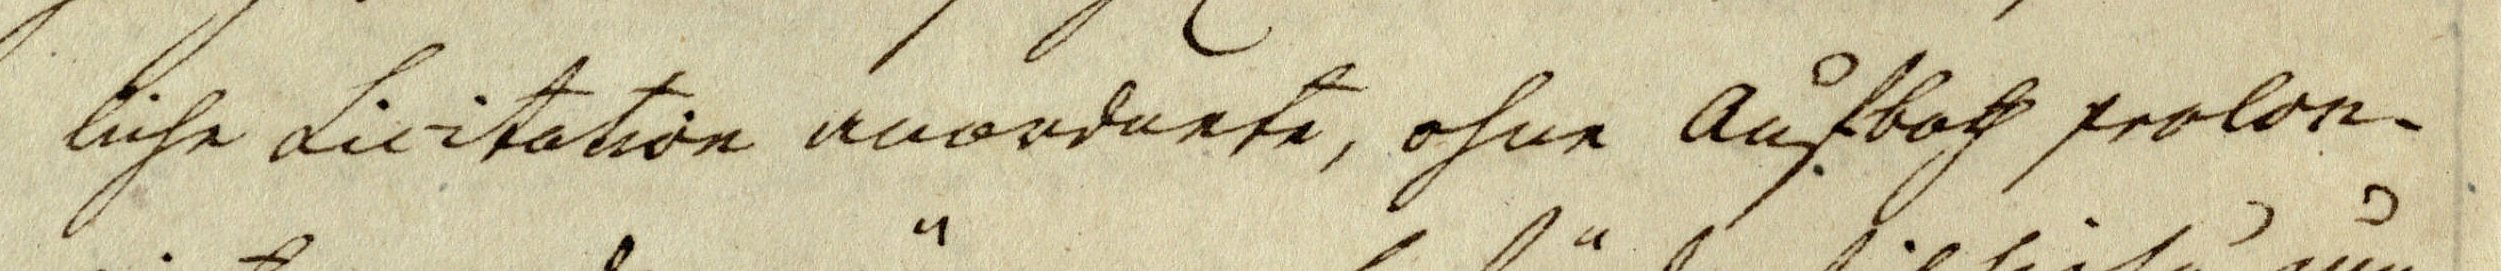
liche Licitation anordnete, ohne Aufboth prolon¬
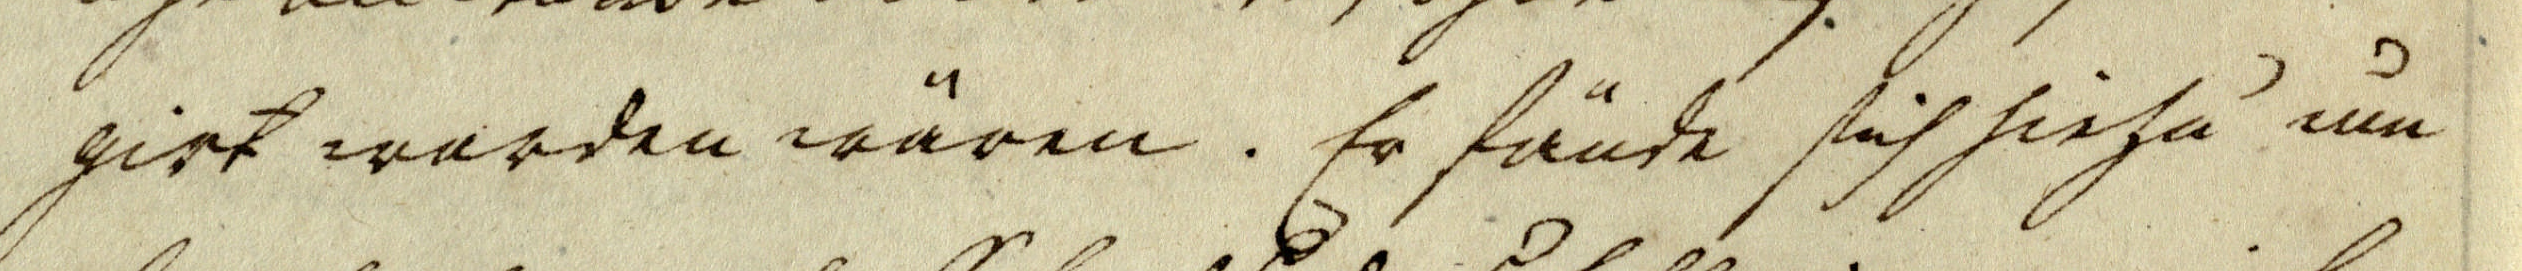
girt worden wären. Er fände sich hiezu um
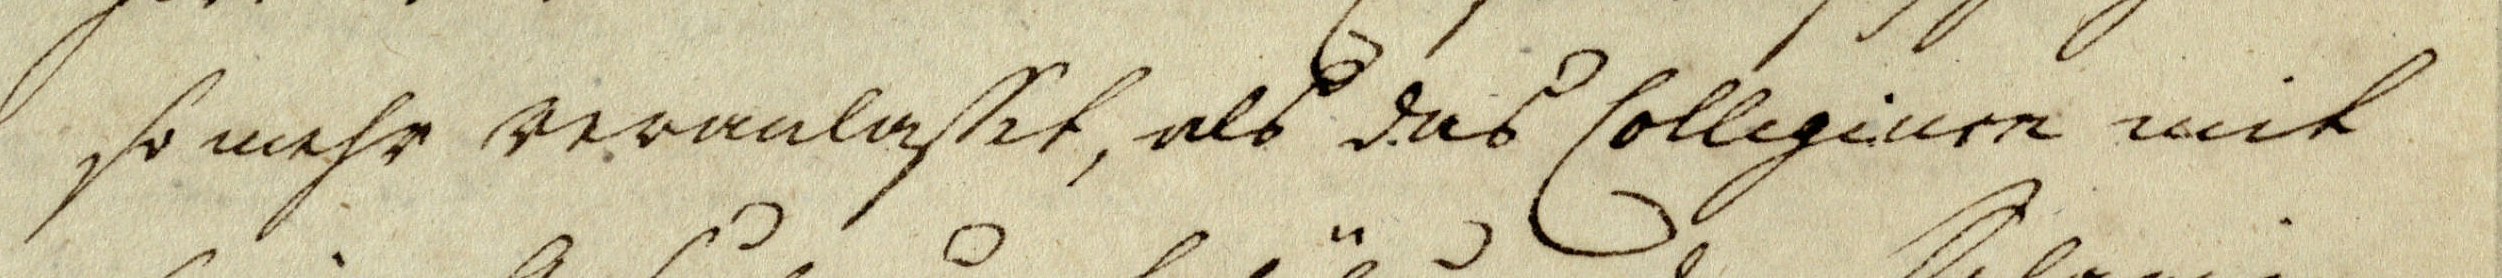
so mehr veranlasset, als das Collegium mit
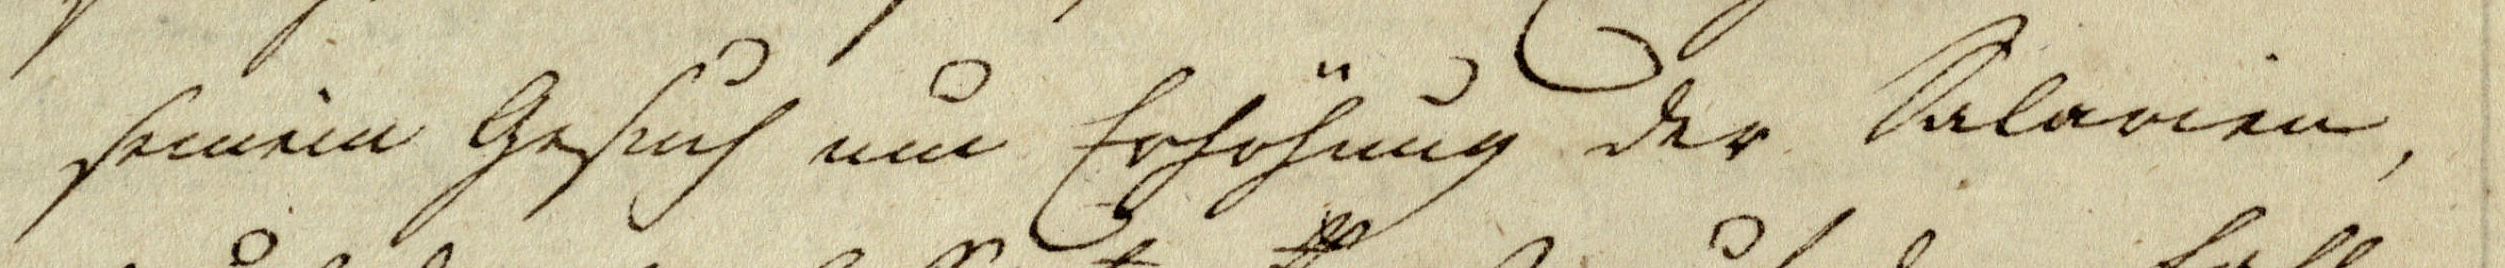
seinem Gesuch um Erhöhung der Salarien
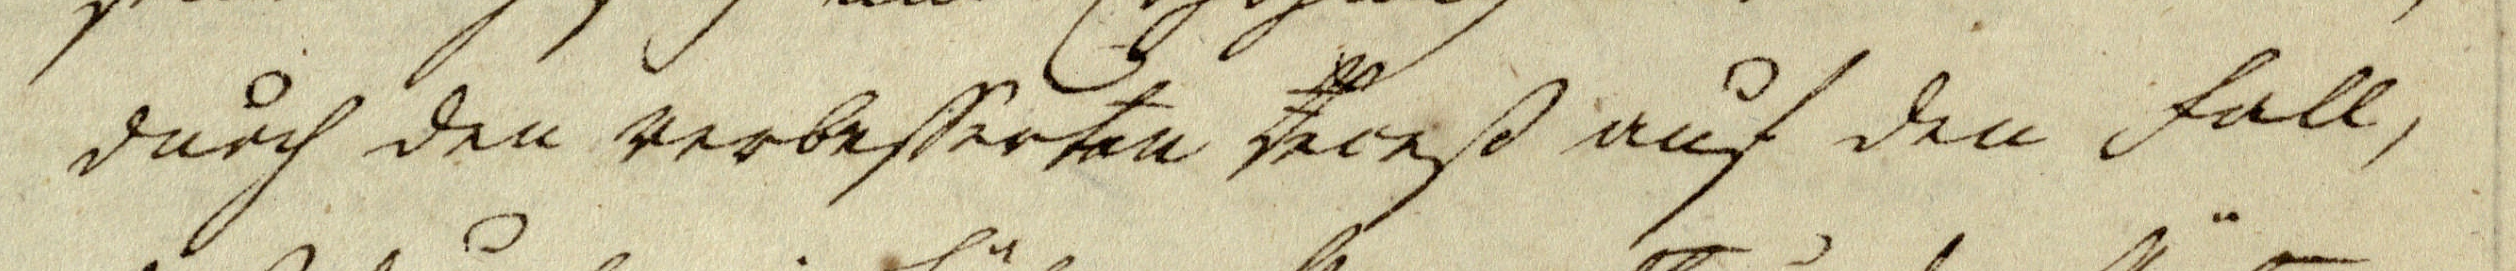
durch den verbesserten Receß auf den Fall,
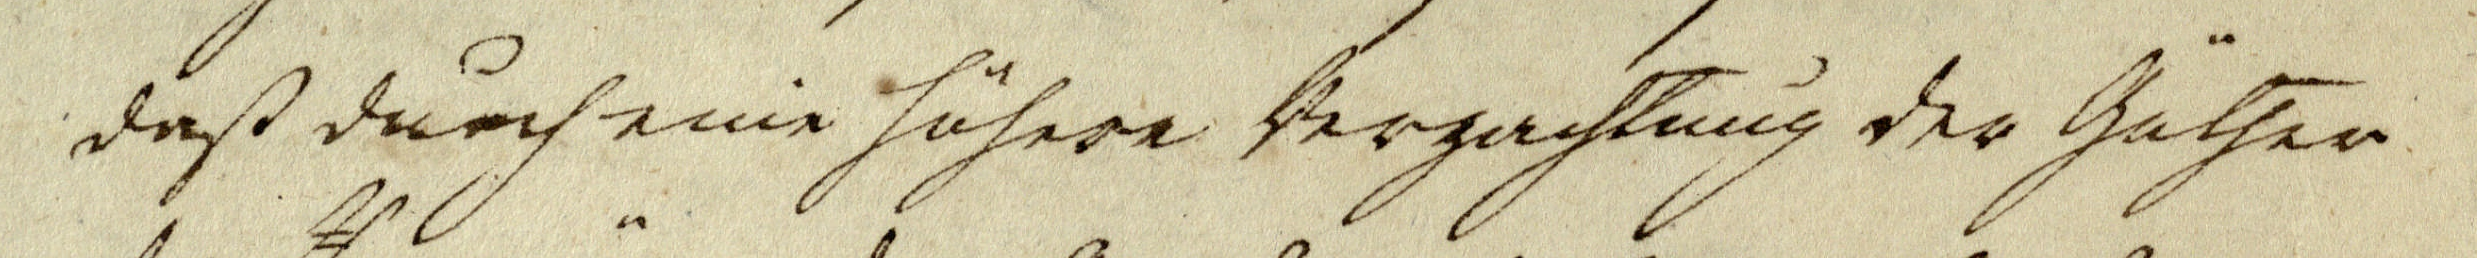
daß durch eine höhere Verpachtung der Güther
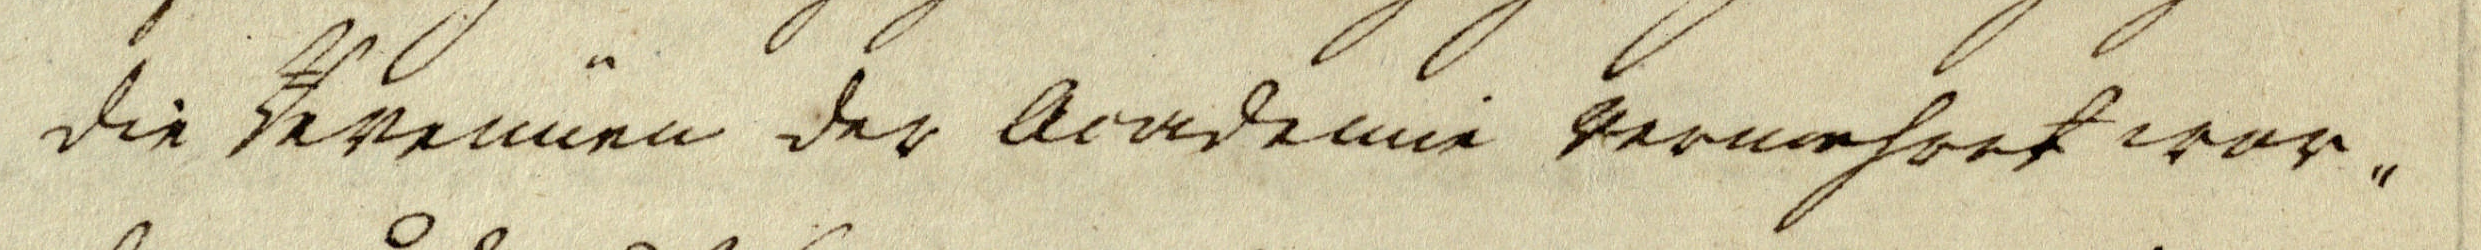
die Revenüen der Academie vermehret wor¬
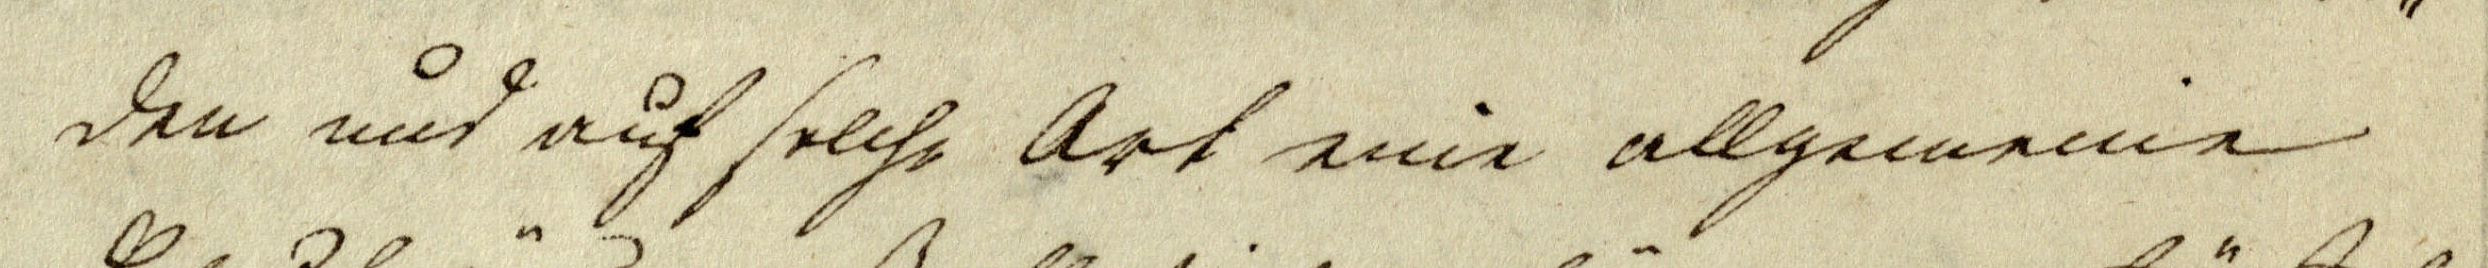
den und auf solche Art eine allgemeine
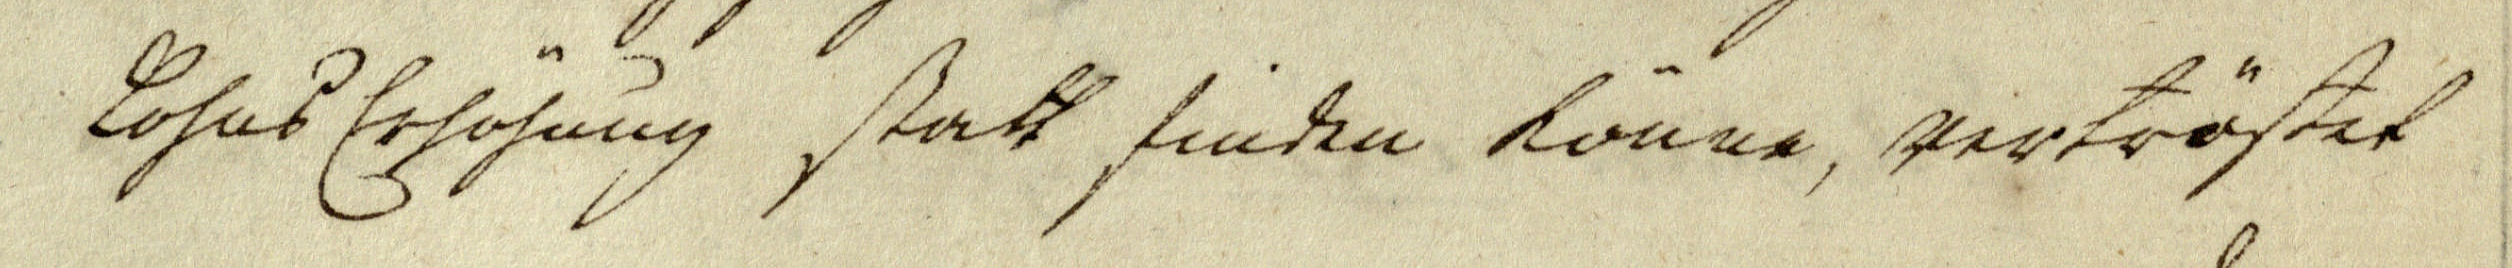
Lohns Erhöhung statt finden könne, vertröstet
